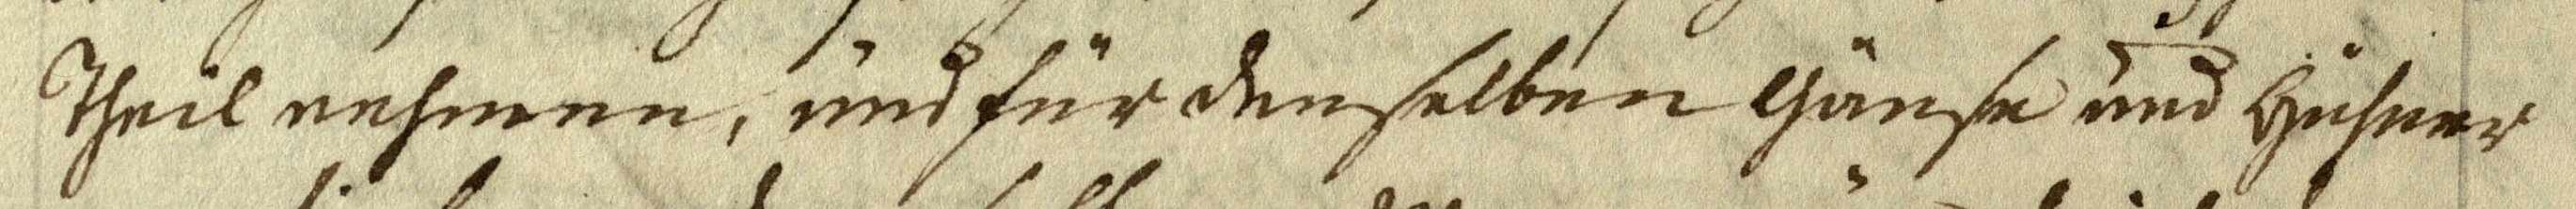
Theil nehmen, und für denselben Gänse und Hühner
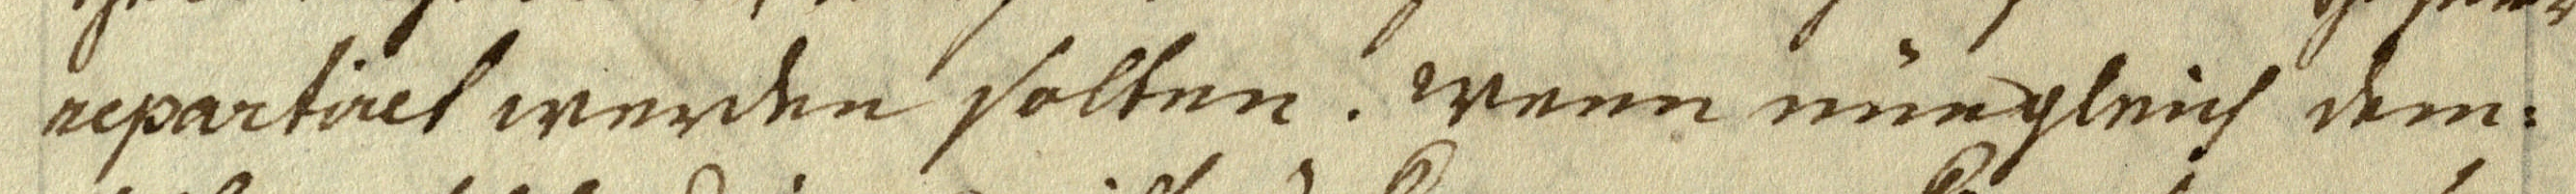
repartiret werden solten. wenn nungleich dem¬
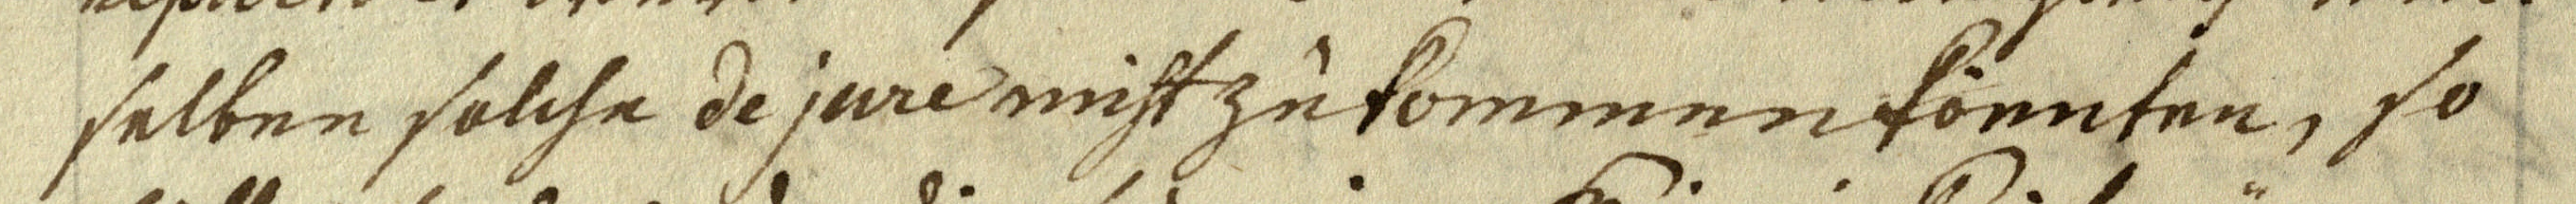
selben solche de jure nicht zukommen könnten, so
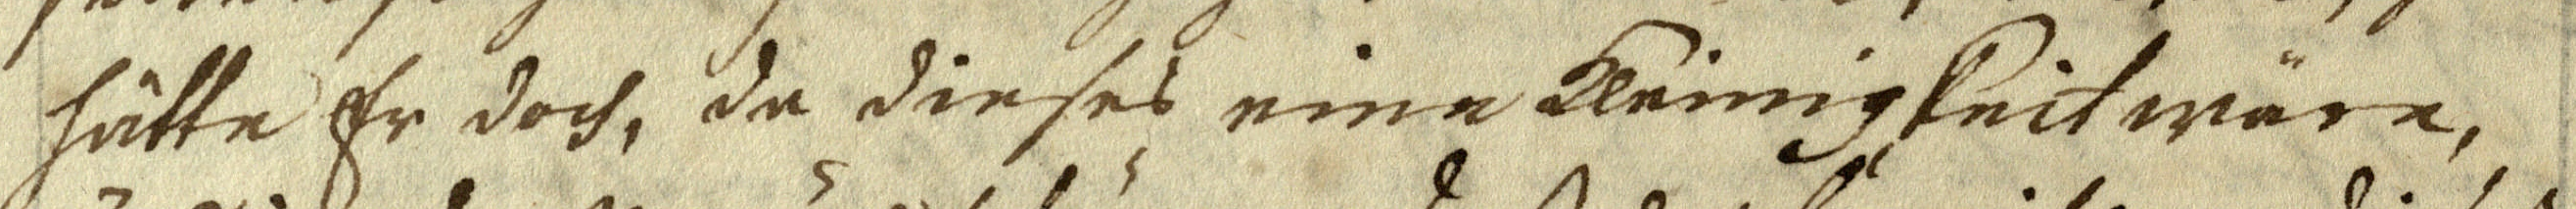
hätte Er doch, da dieses eine Kleinigkeit wäre,
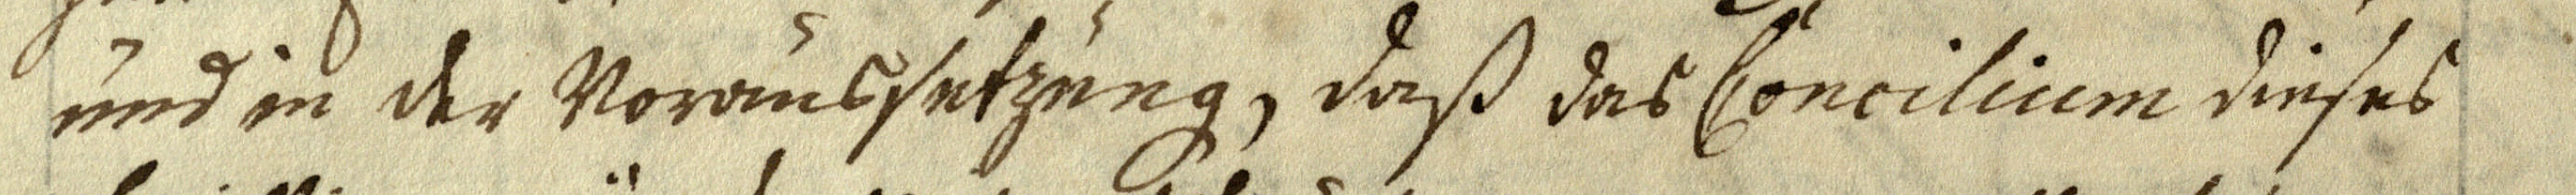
und in der Voraussetzung, daß das Concilium dieses
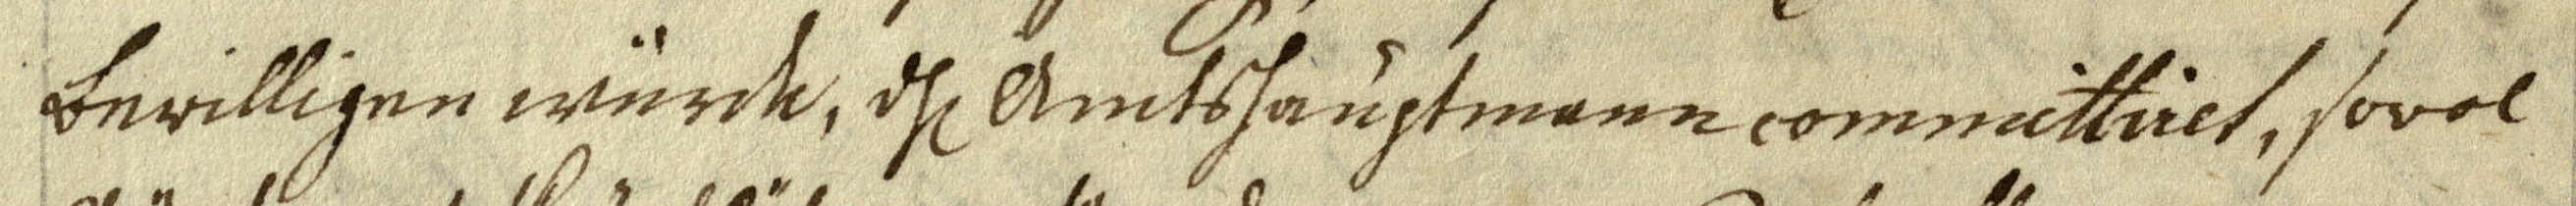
bewilligen würde, dh Amtshauptmann commitiret, sowol
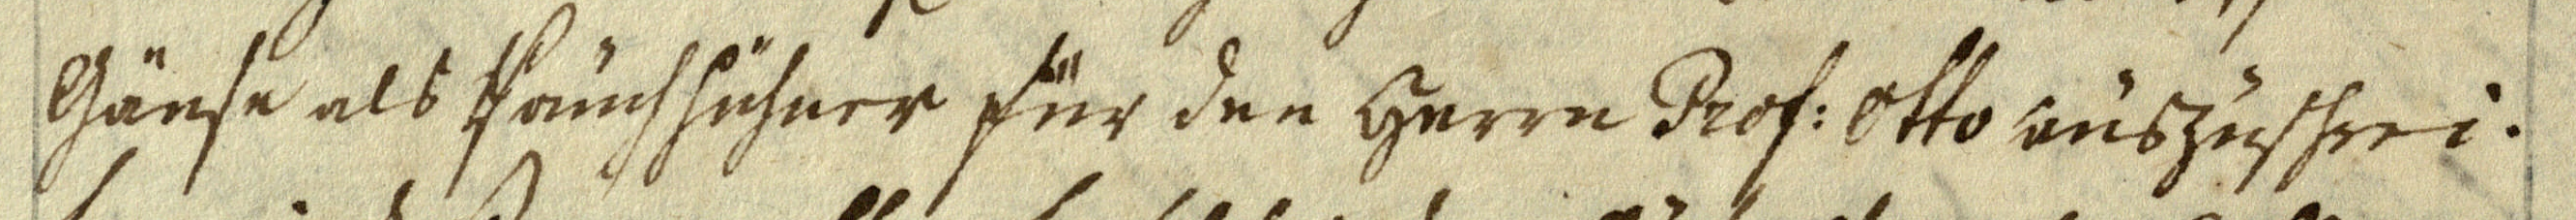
Gänse als Rauchhühner für den Herrn Prof: Otto auszuschrei¬
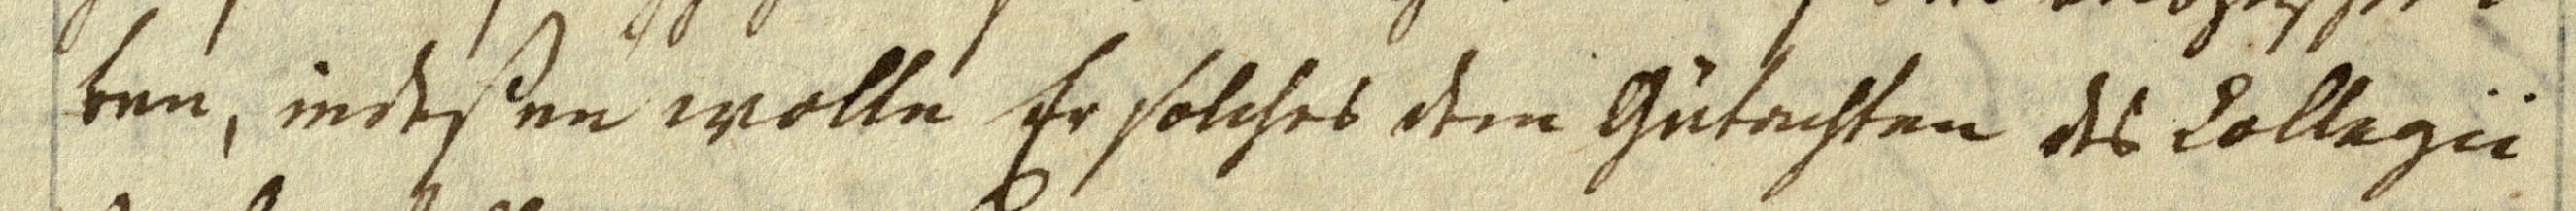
ben, indeßen wolle Er solches dem Gutachten des Collegii
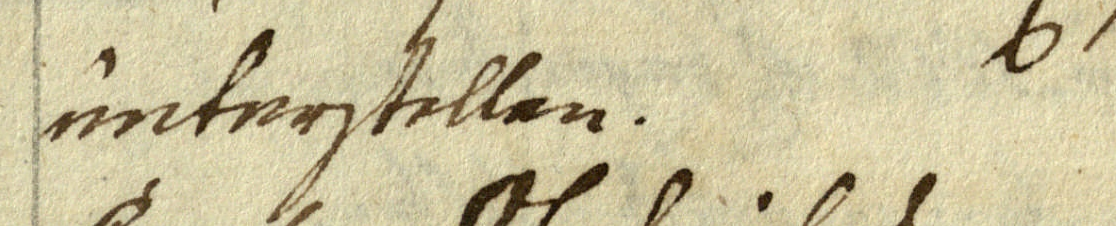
unterstellen.
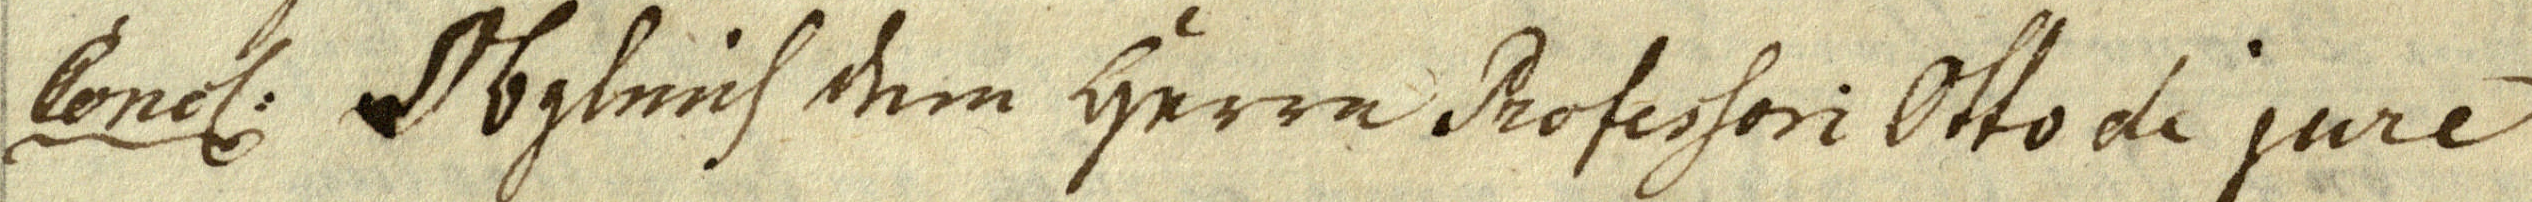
Concl: Obgleich dem Herrn Professori Otto de jure
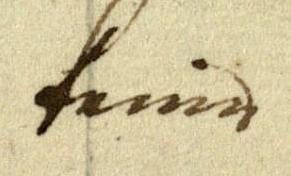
keine
